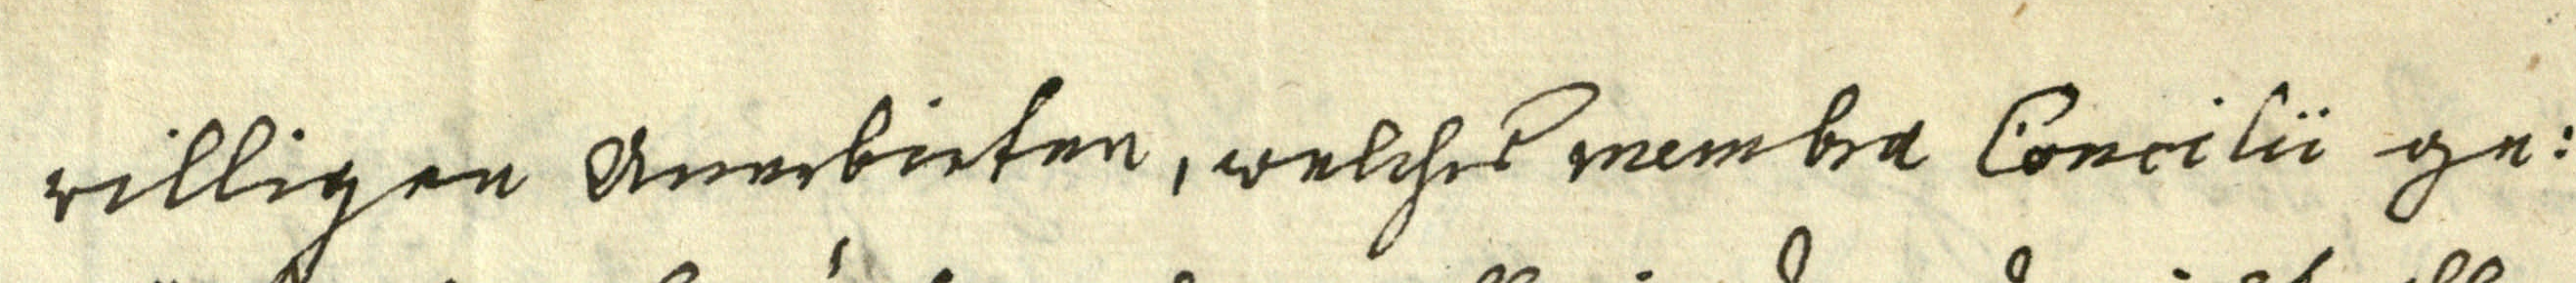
willigen Anerbieten, welches membra Concilii ge¬
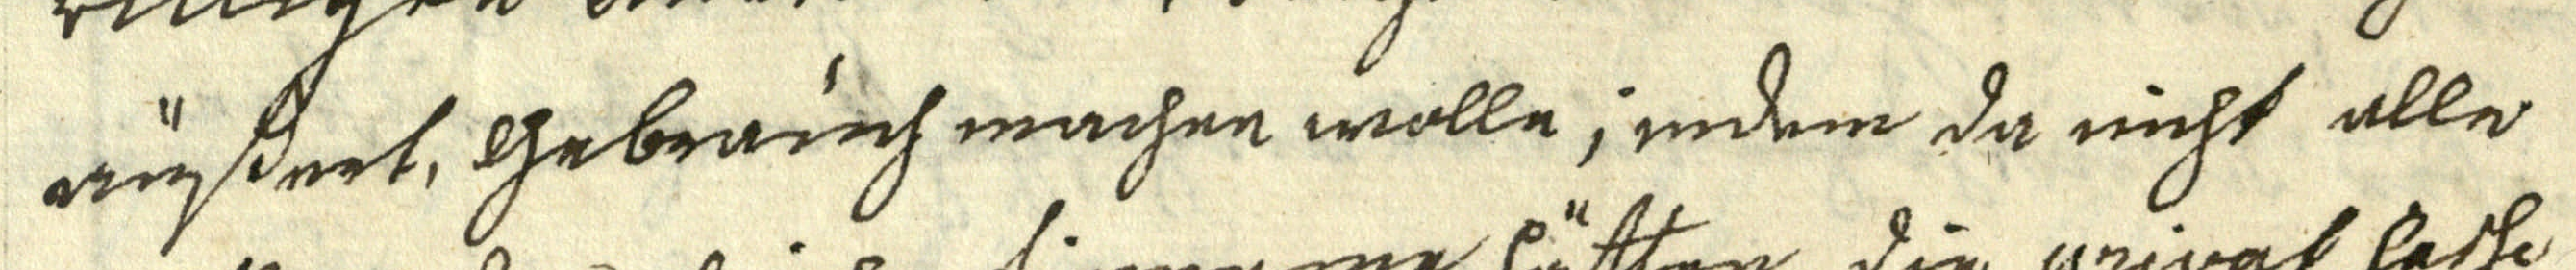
äußert, Gebrauch machen wolle, indem da nicht alle
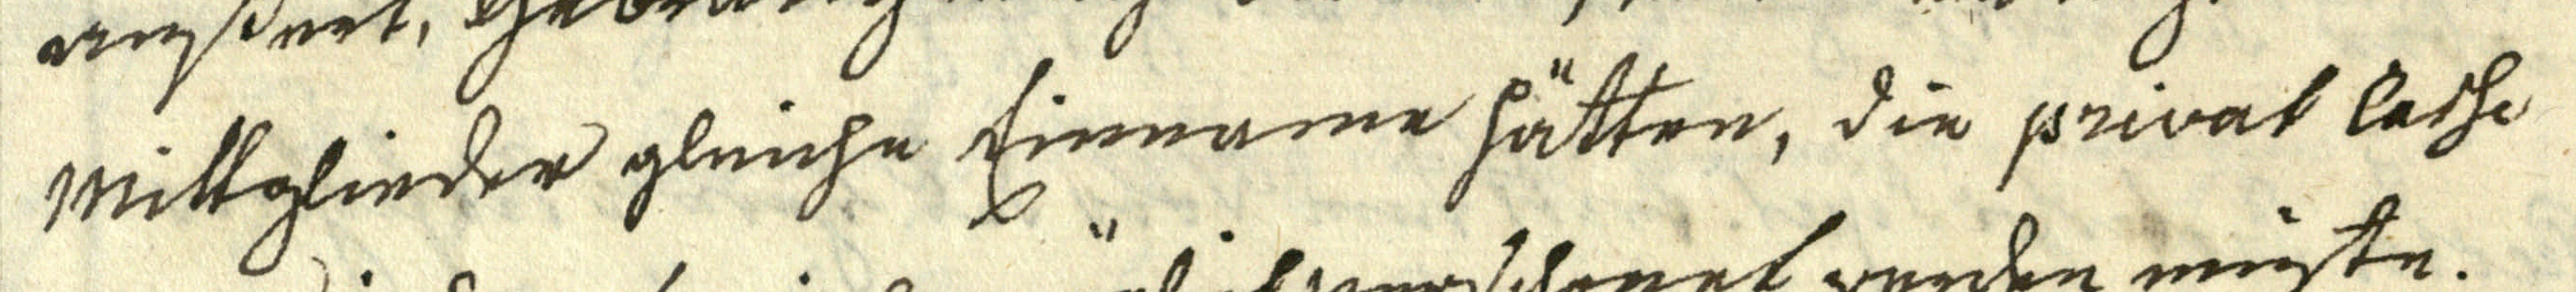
Mittglieder gleiche Einnahme hätten, die privat Casse
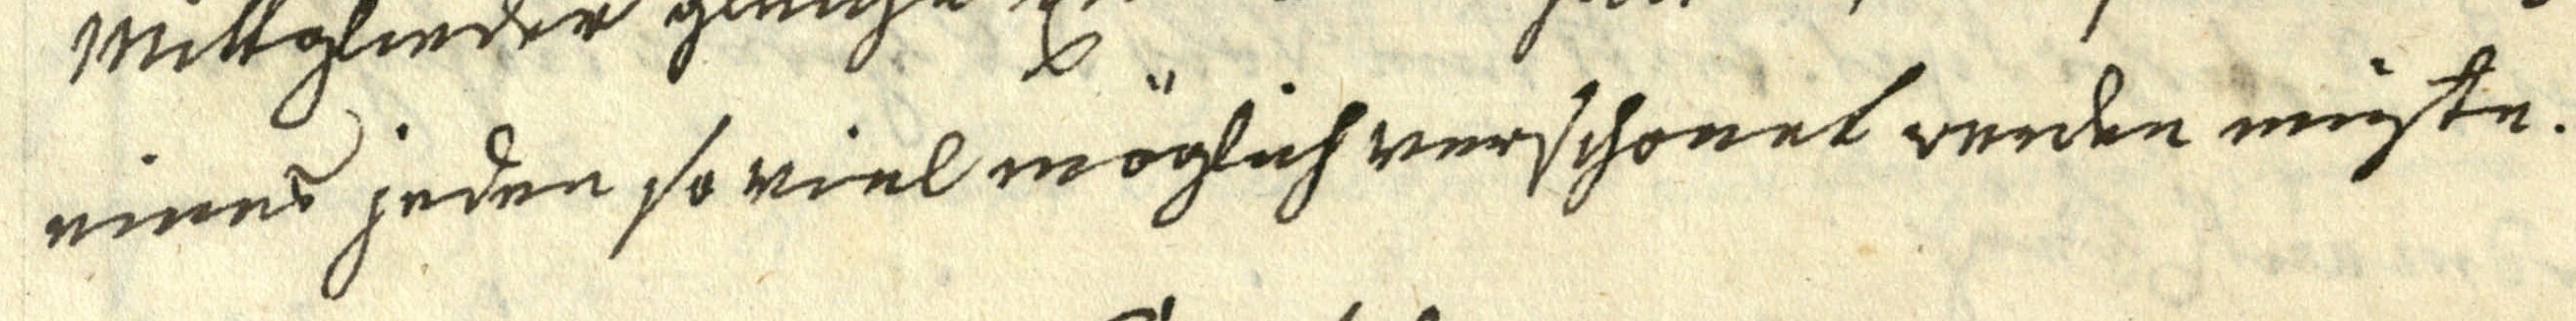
eines jeden so viel möglich verschonet werden müste.
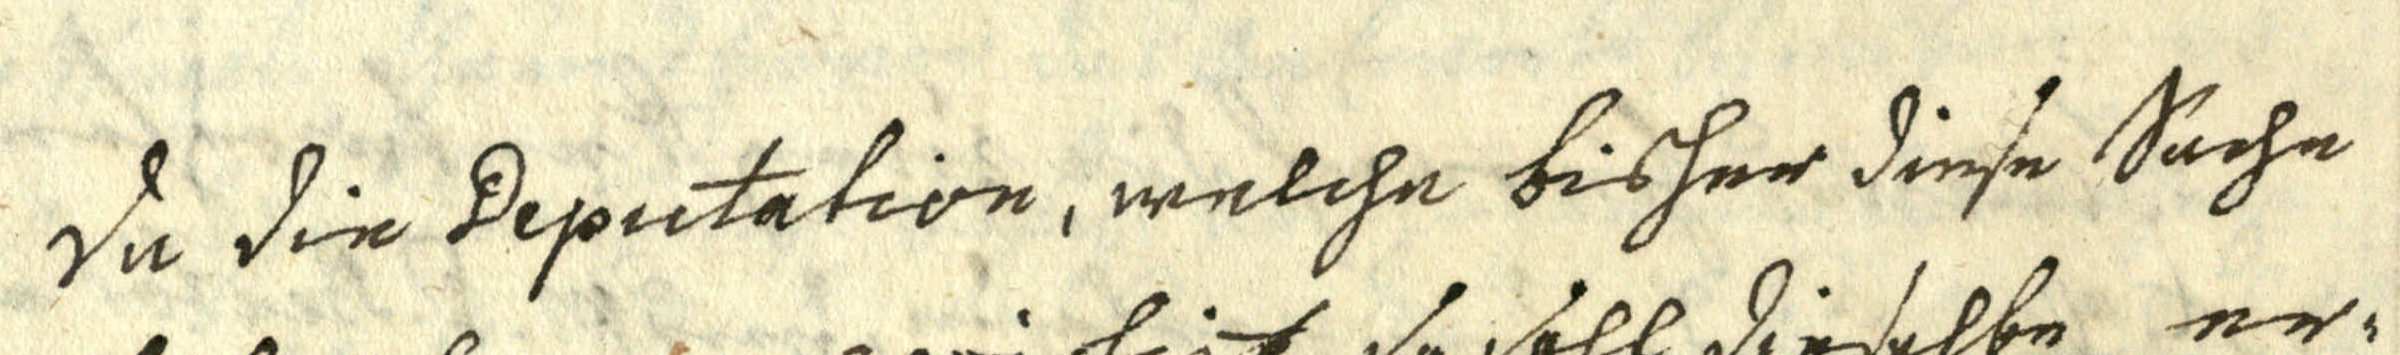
Da die Deputation, welche bisher diese Sache
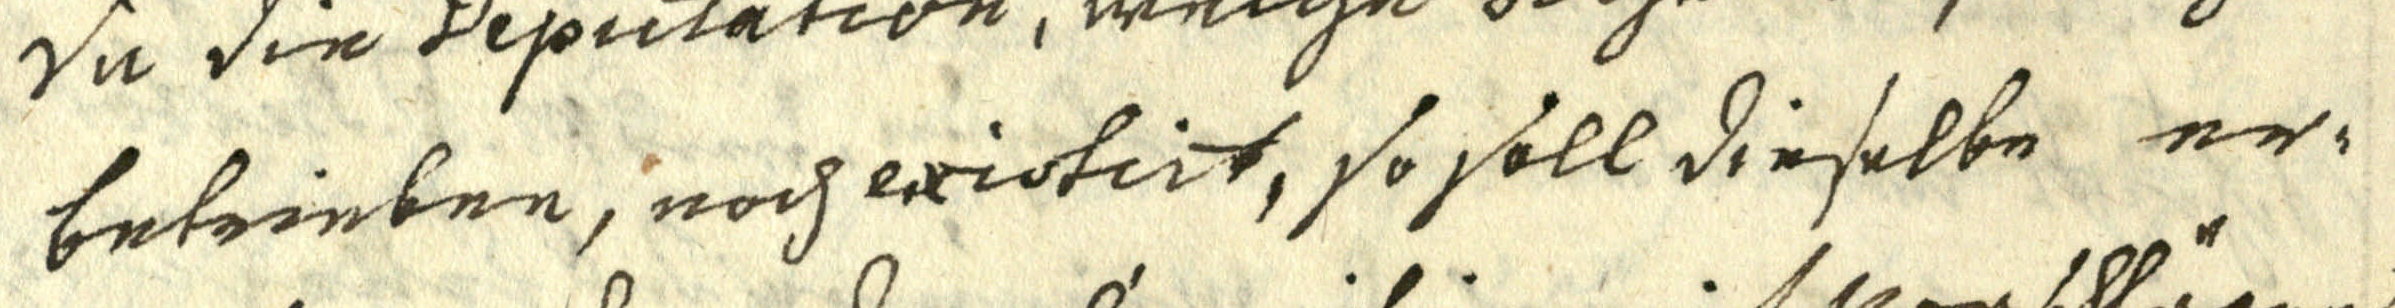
betrieben, noch existirt, so soll dieselbe er¬
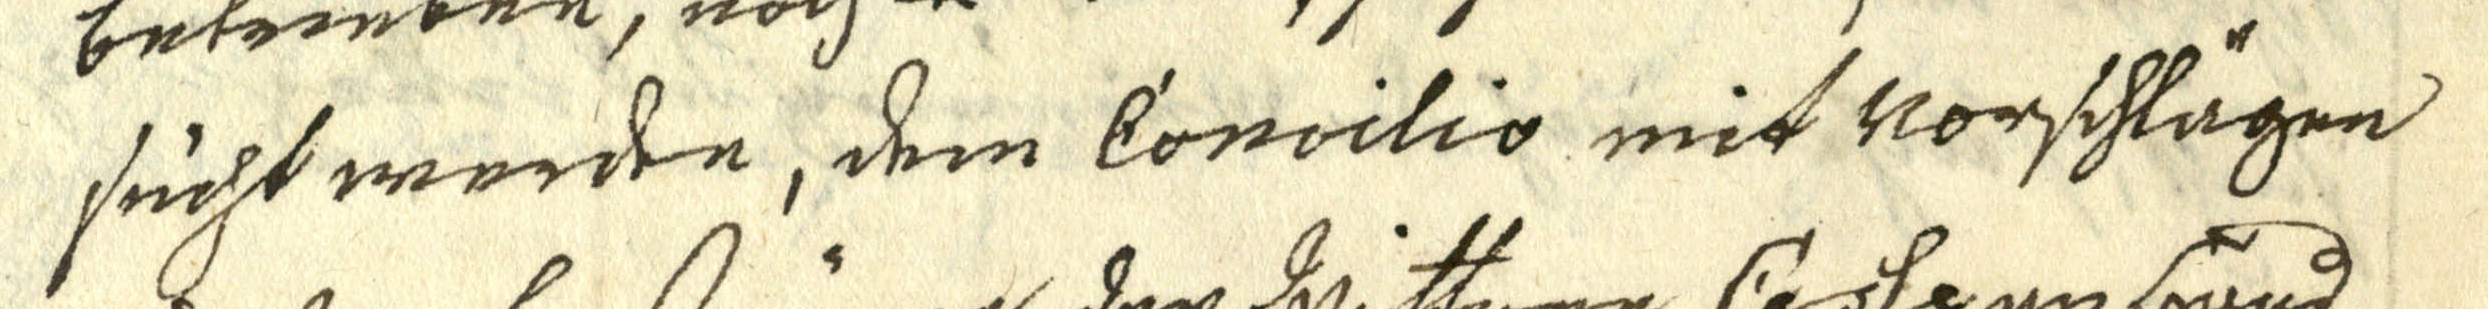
sucht werden, dem Concilio mit Vorschlägen
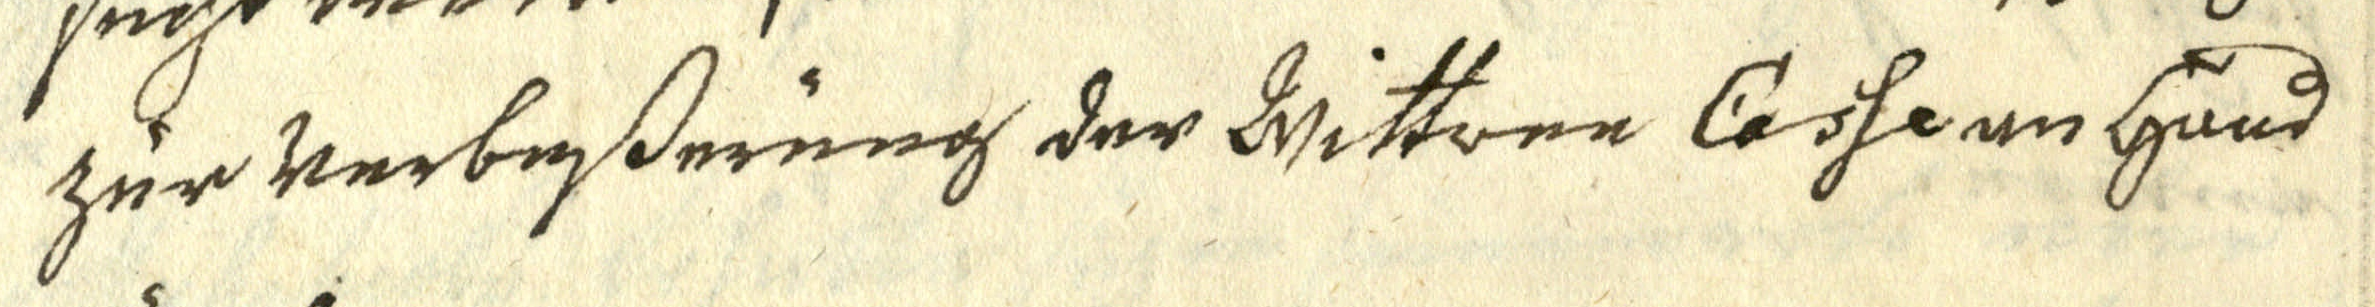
zur Verbeßerung der Wittwen Casse an Hand
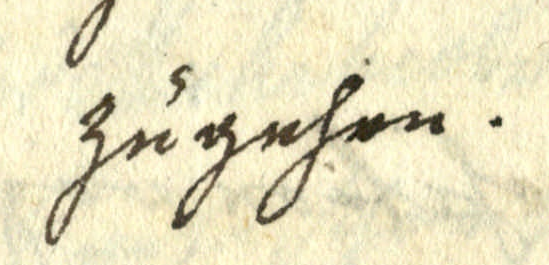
zugehen.
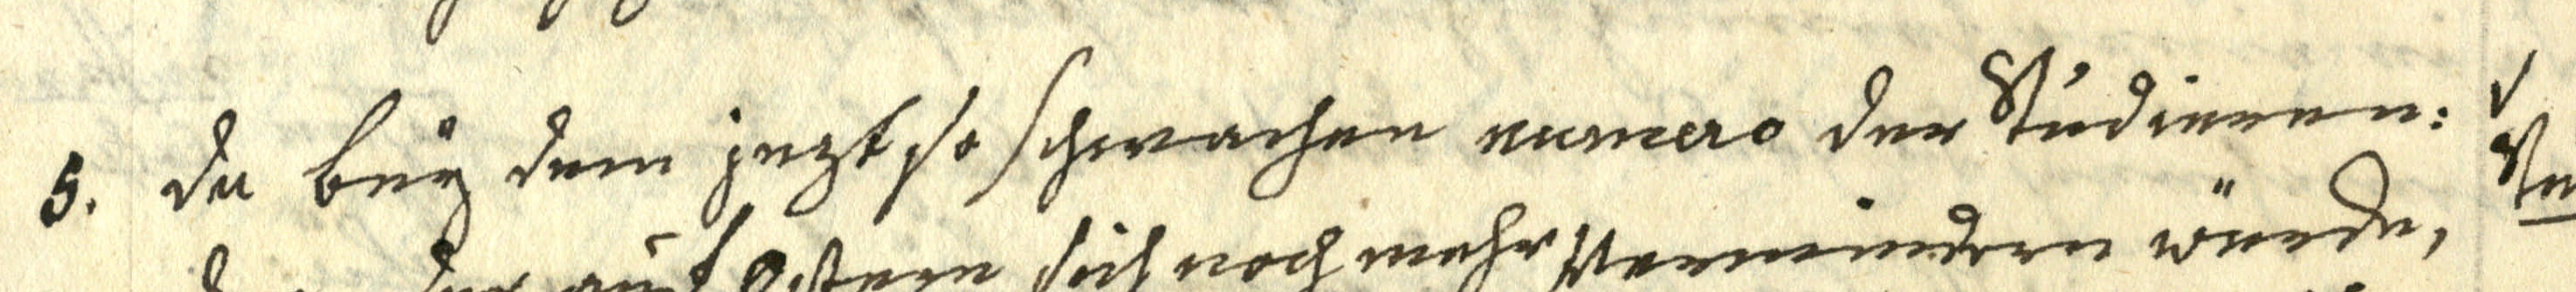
5. Da beÿ dem jezt so schwachen nunmero der Studieren¬
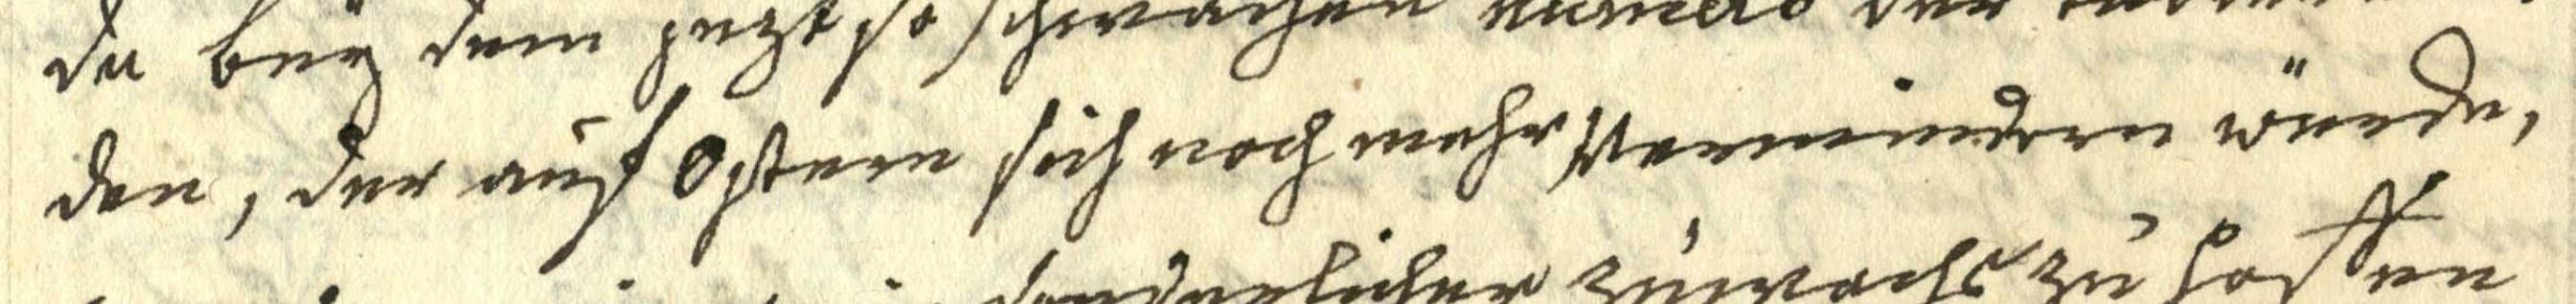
den, der auf Ostern sich noch mehr vermindern würde,
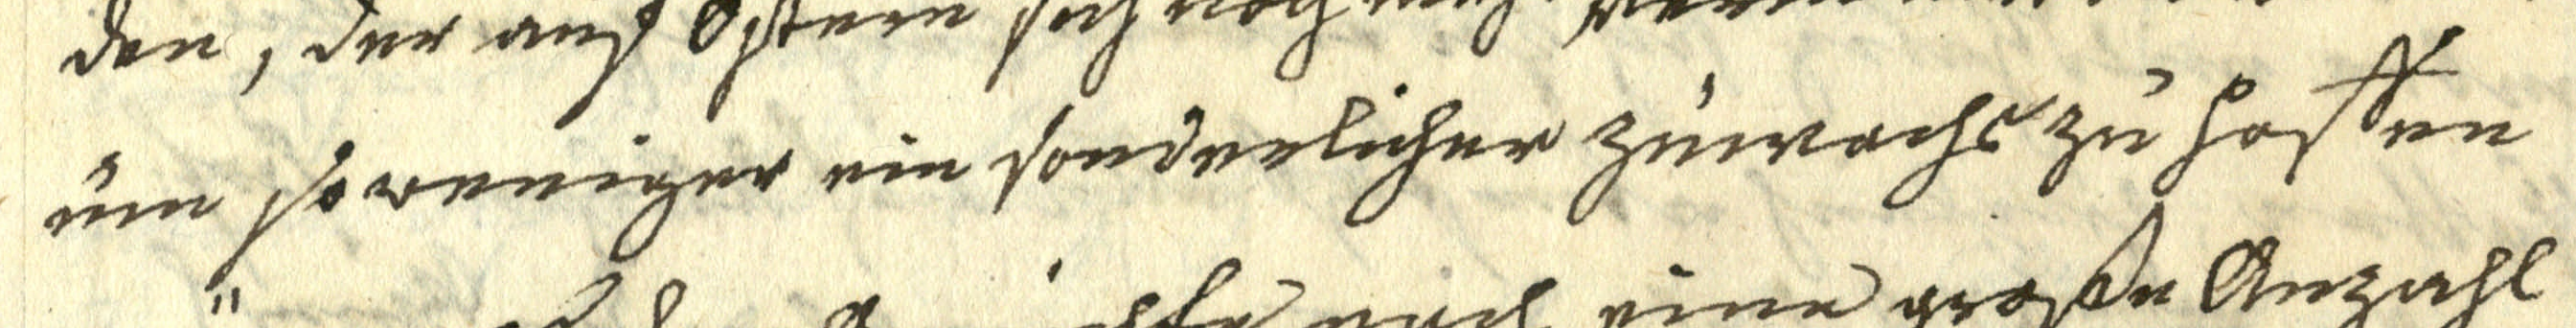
um so weniger ein sonderlicher Zuwachs zu hoffen
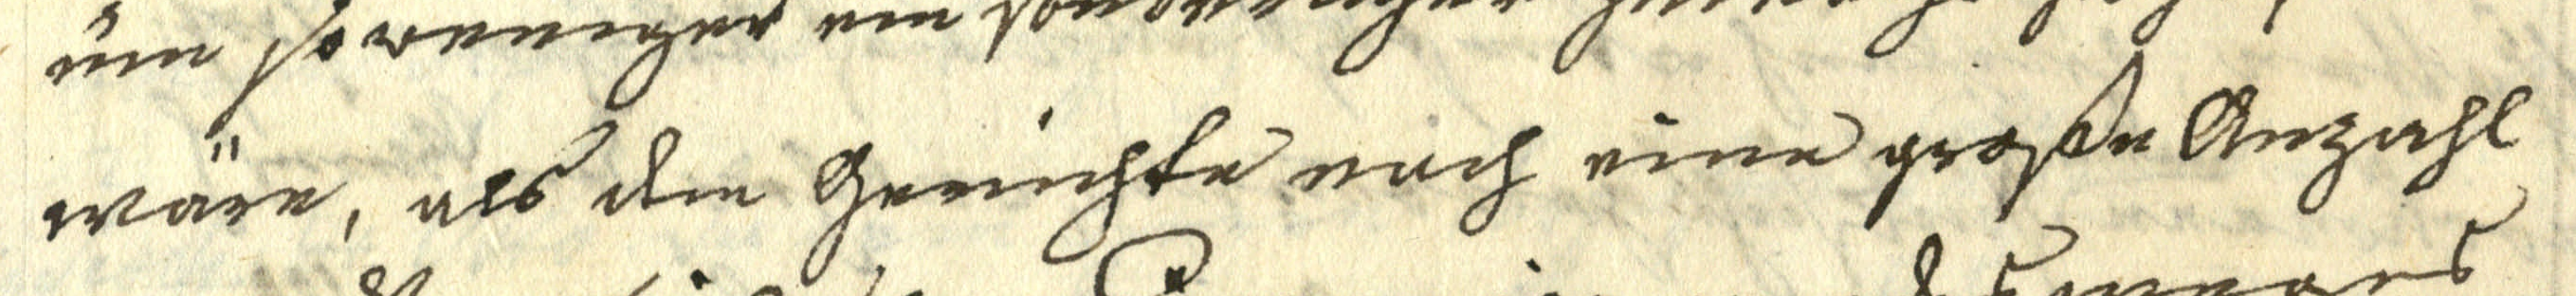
wäre, als dem Gerichte noch eine große Anzahl
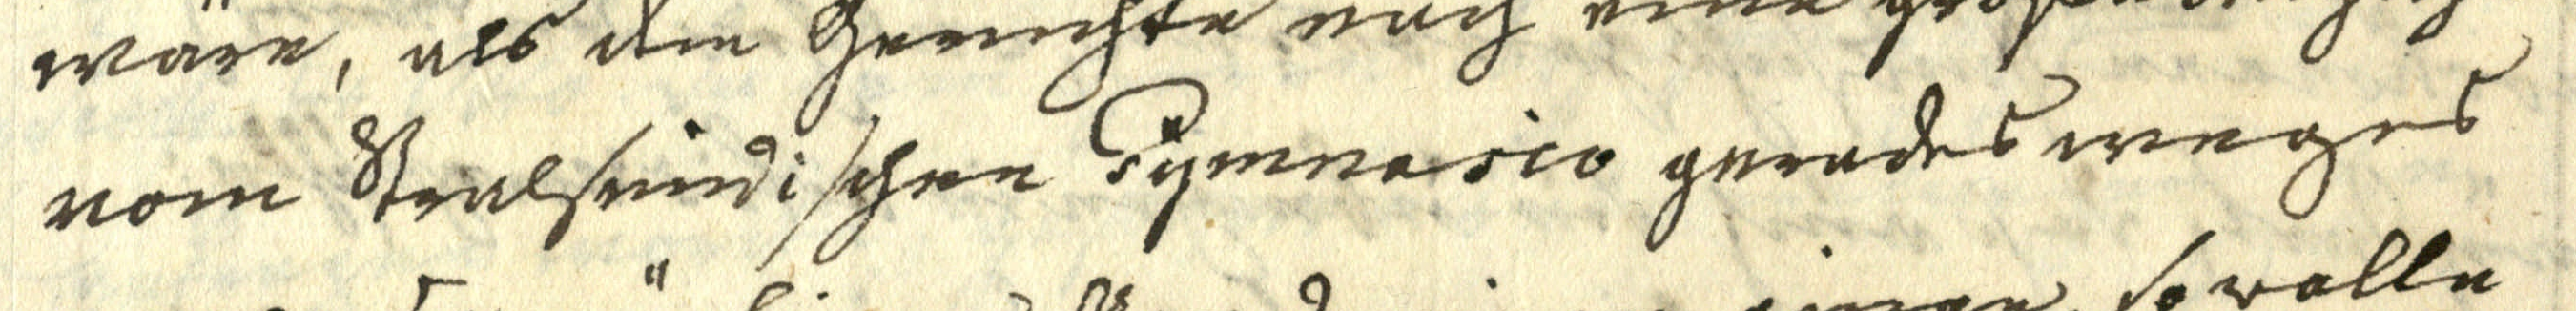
vom Stralsundischen Gÿmnasio gerades weges
